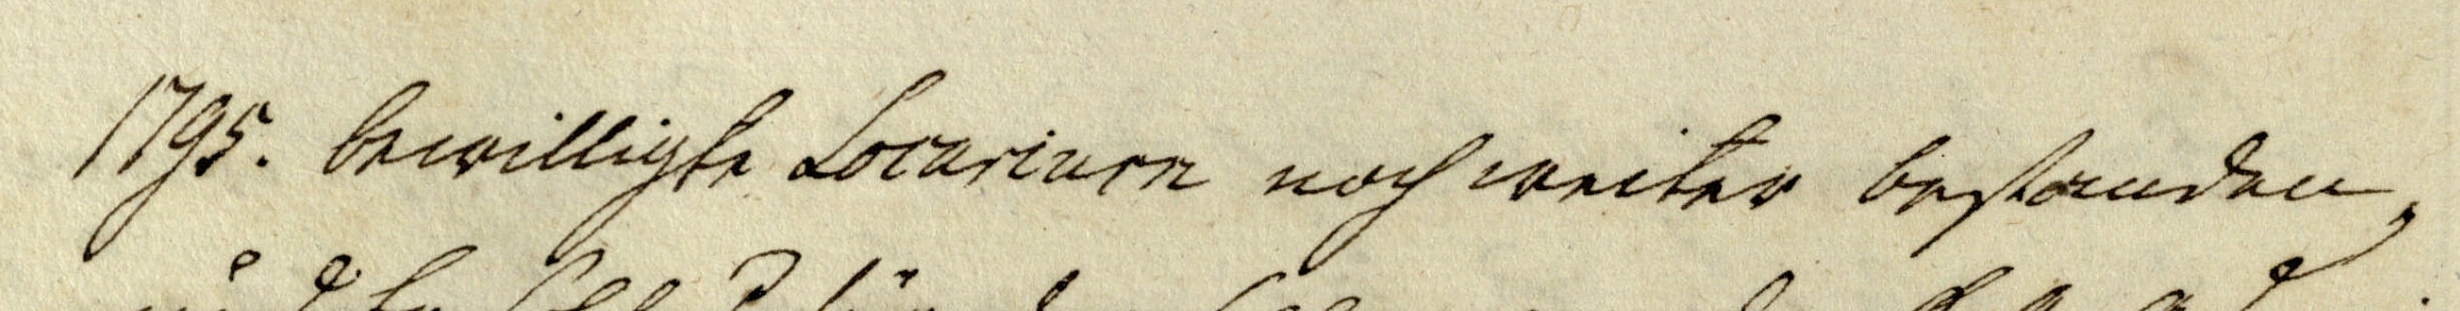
1795. bewilligte Locarium noch weiter bestanden
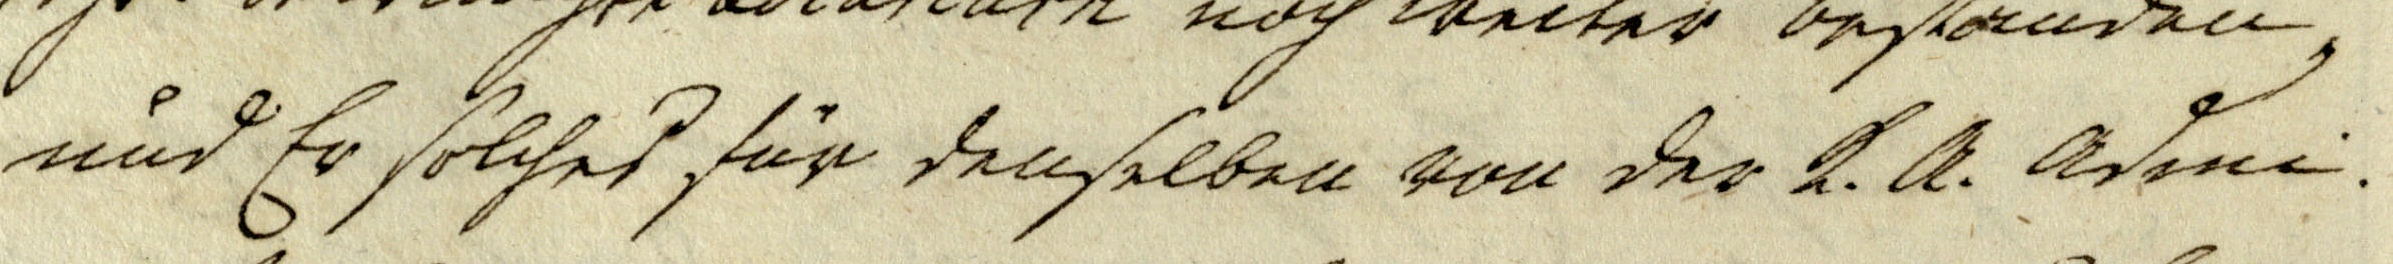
und Er solches für denselben von der K. A. Admi¬
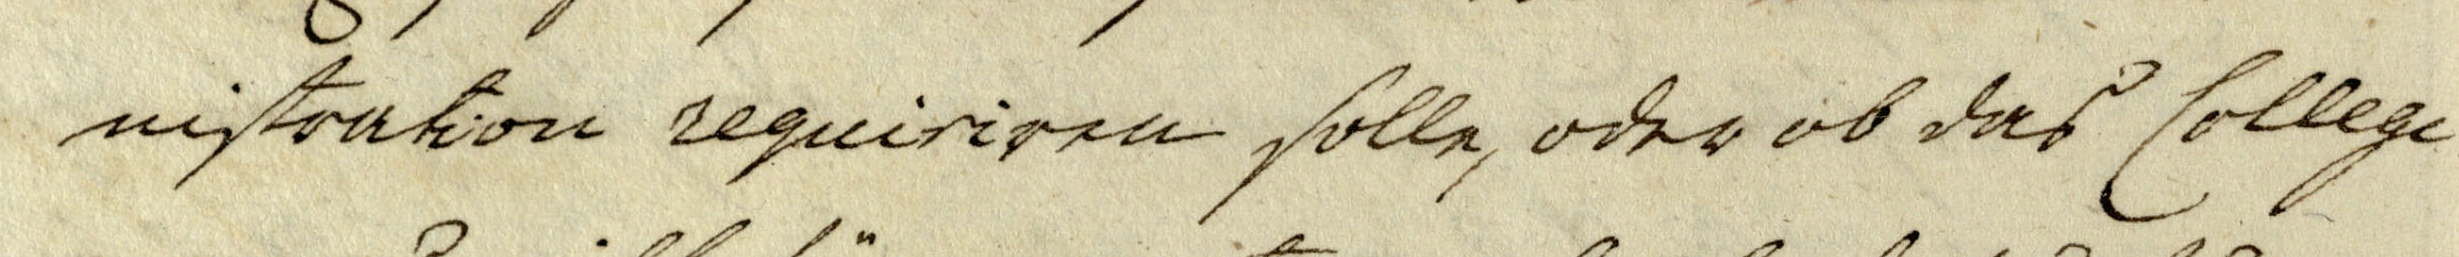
nistration requiriren solle, oder ob das Collegi¬
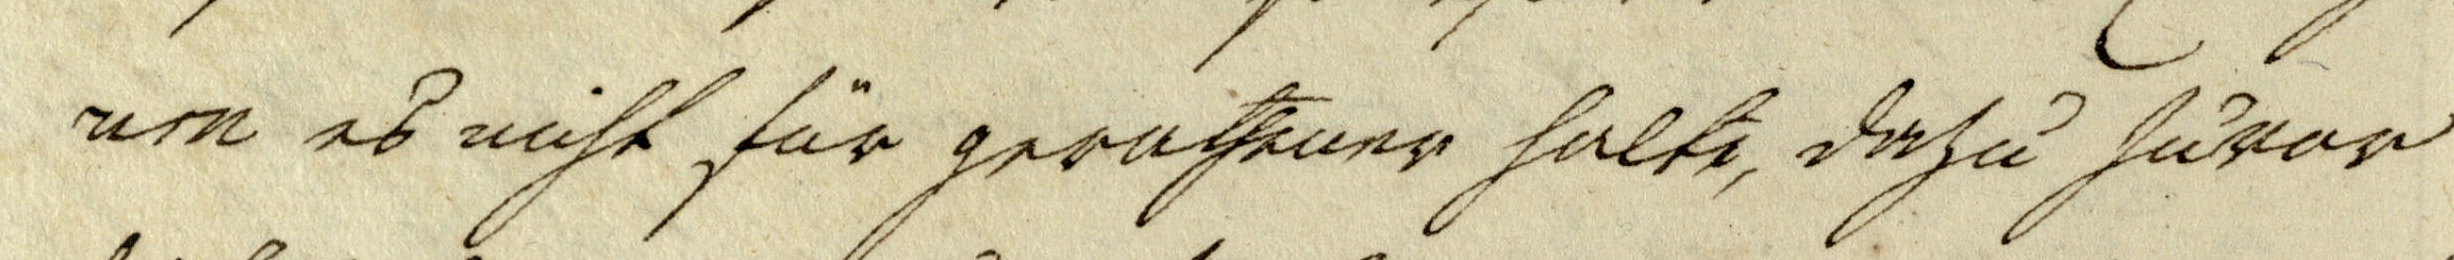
um es nicht für gerathener halte, dazu zuvor
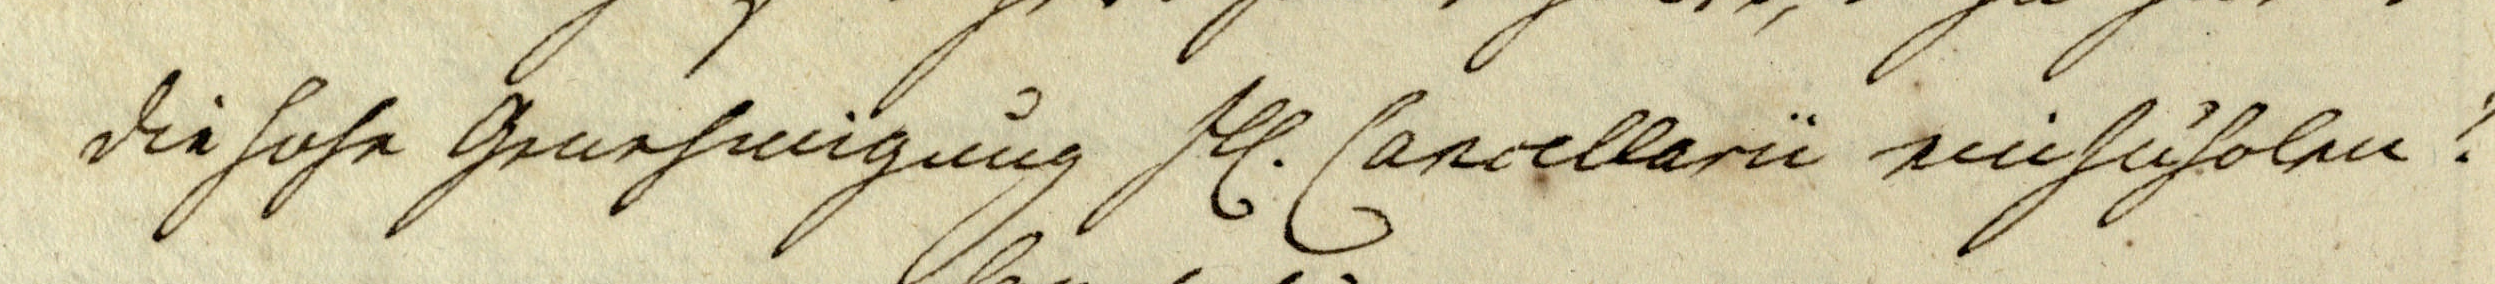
die hohe Genehmigung Ill. Cancellarii einzuholen?
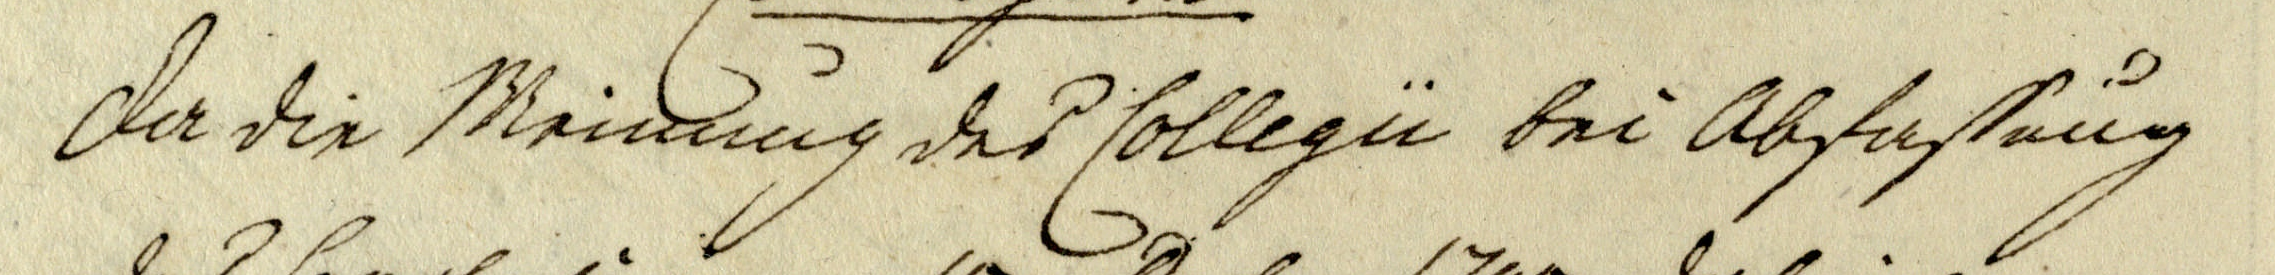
Da die Meinung des Collegii bei Abfassung
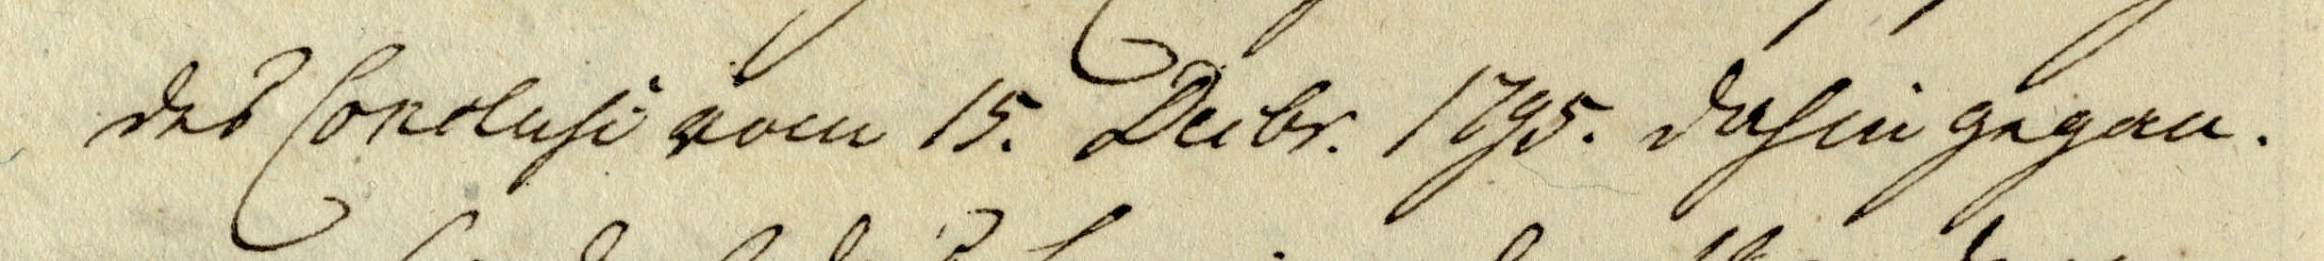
des Conclusi vom 15. Decbr. 1795. dahin gegan¬
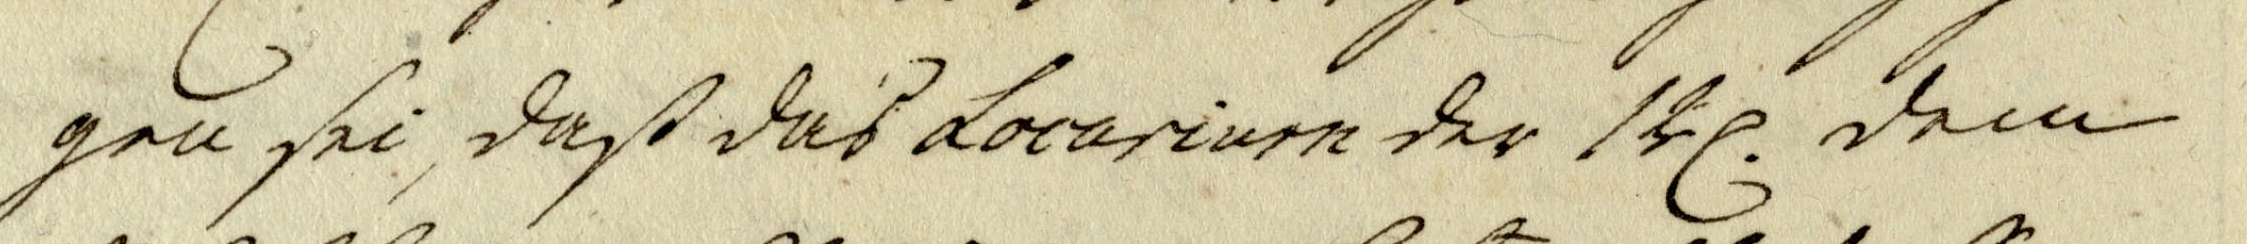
gen sei, daß das Locarium der 12 l. dem
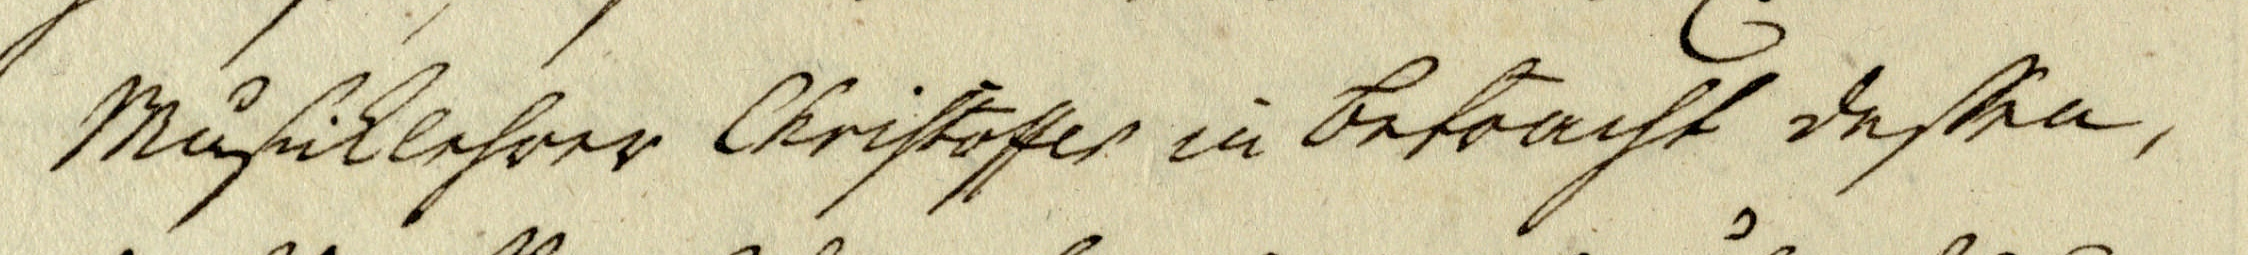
Musicklehrer Christoffer in Betracht dessen,
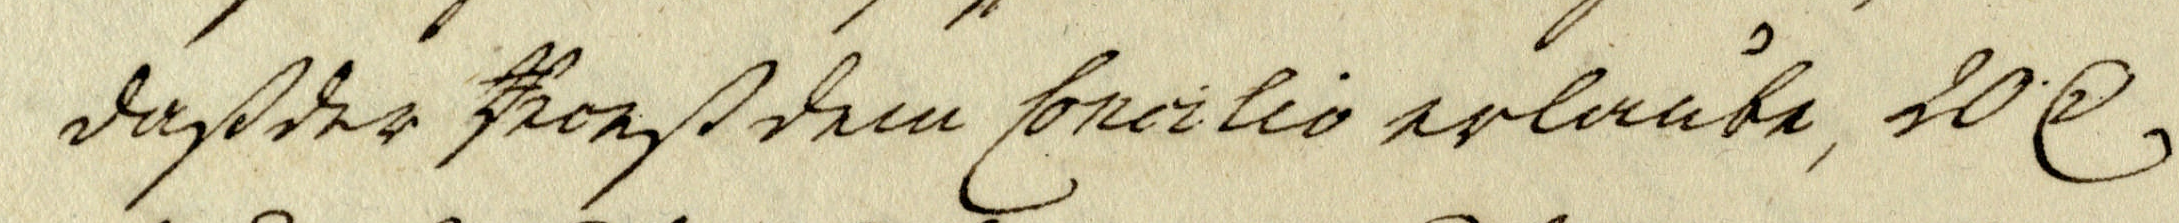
daß der Receß dem Concilio erlaube, 20 l.
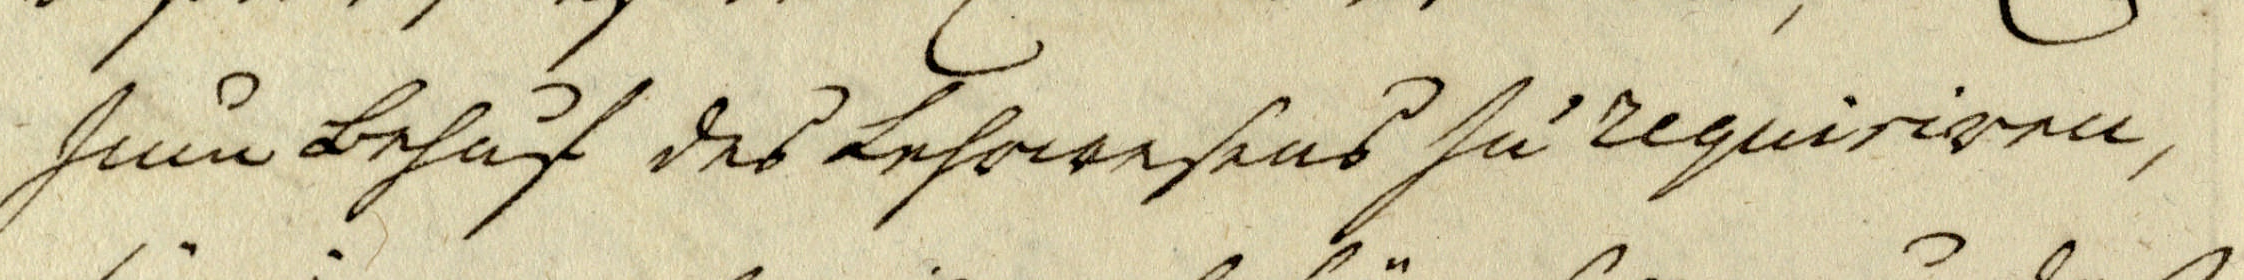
zum Behuf des Lehrwesens zu requiriren,
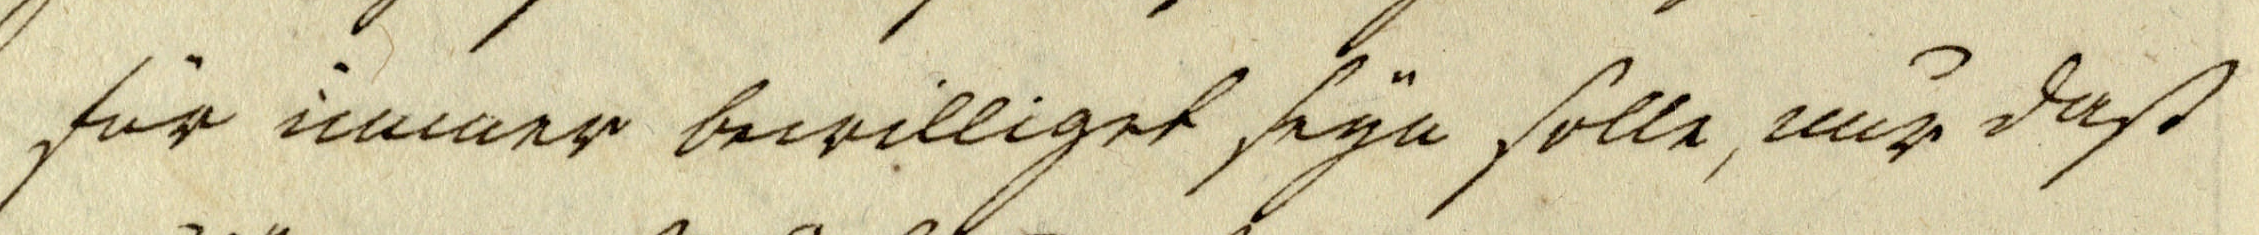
für immer bewilliget seÿn solle, nur daß
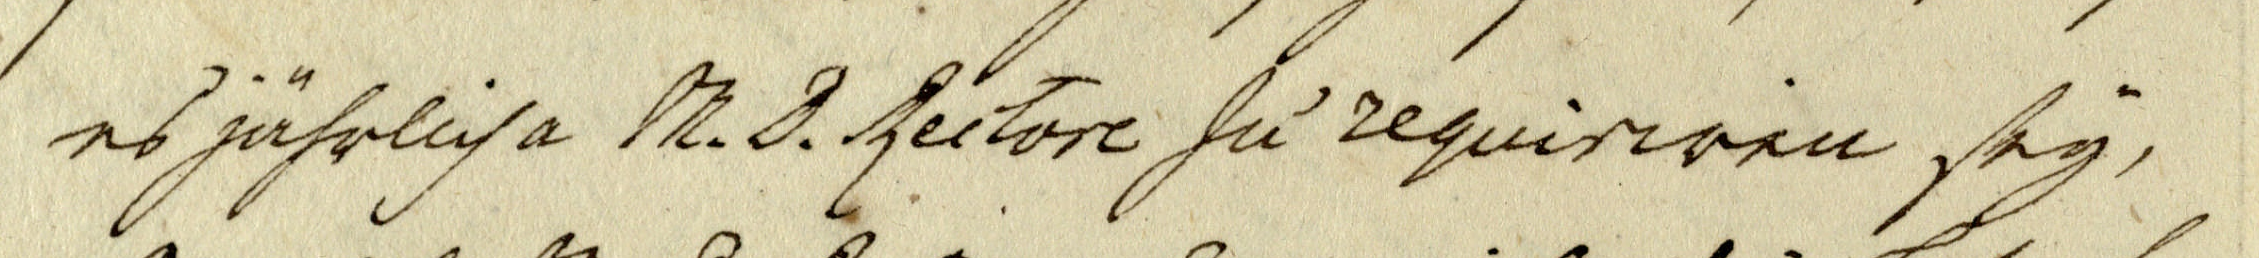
es jährlich a M. D. Rectore zu requiriren seÿ,
